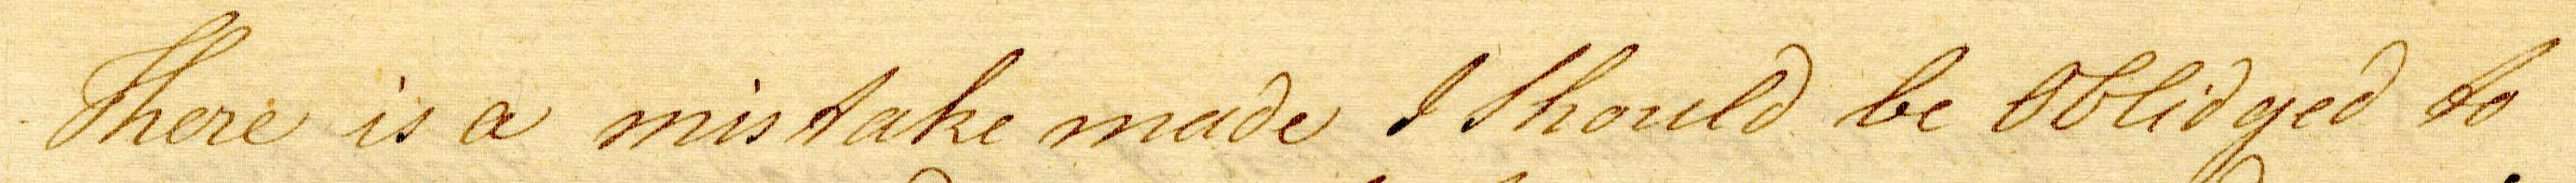There is a mistake made I Should be Oblidged to
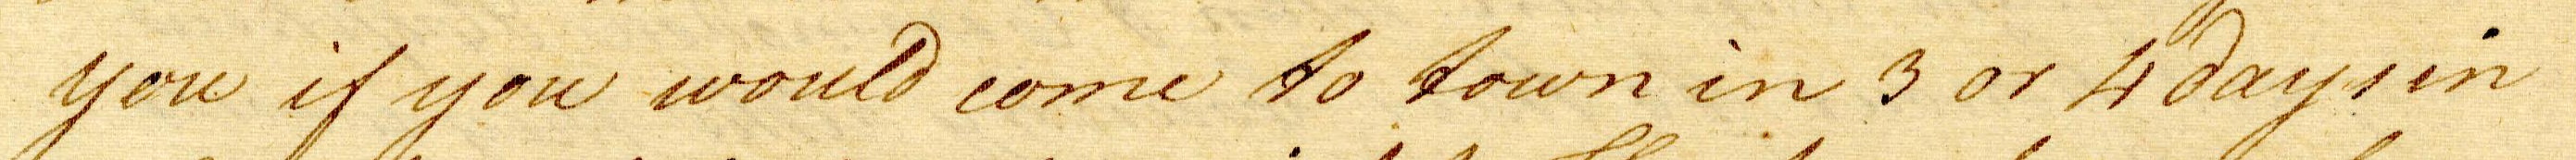You if you would come to town in 3 or 4 days in
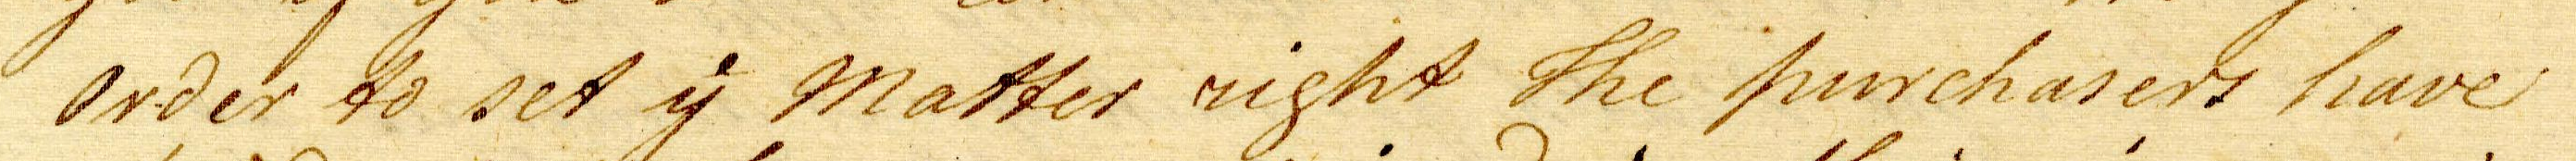order to set y^e Matter right The purchasers have
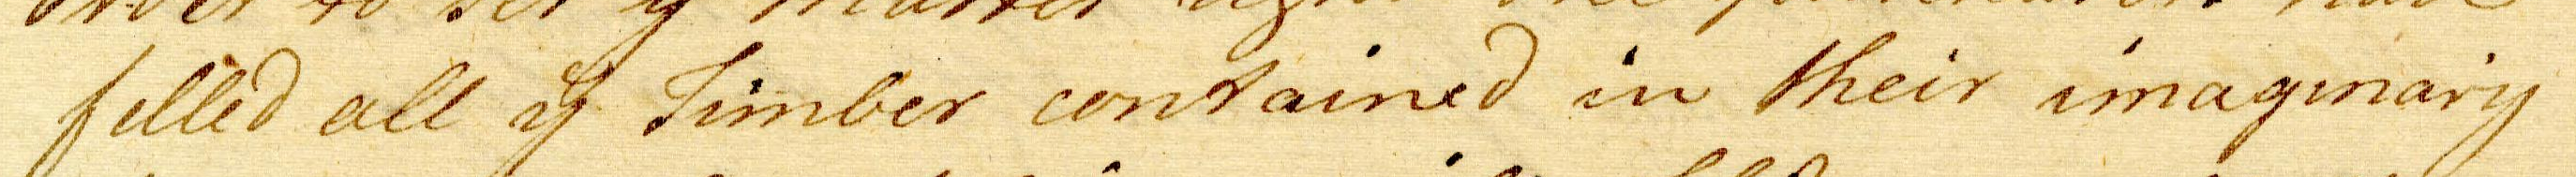felled all y^e Timber contained in their imaginary
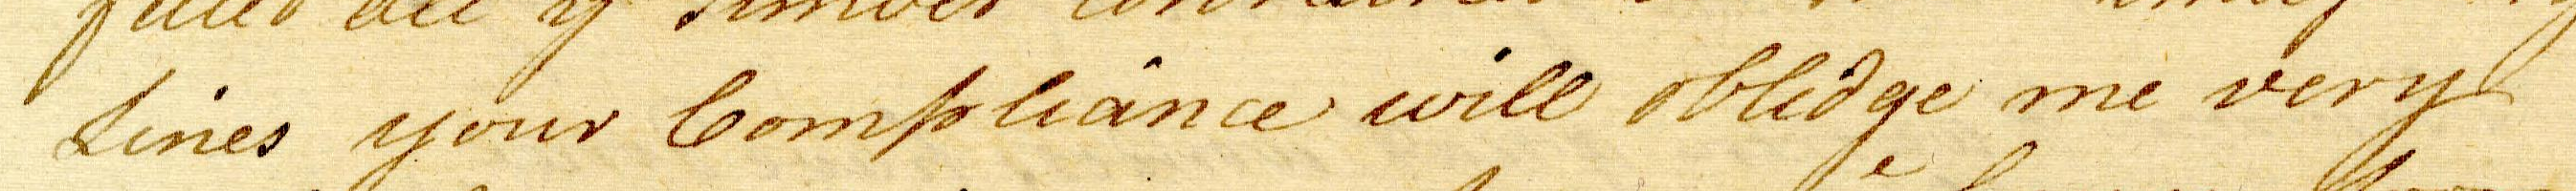Lines your Compliance will oblidge me very
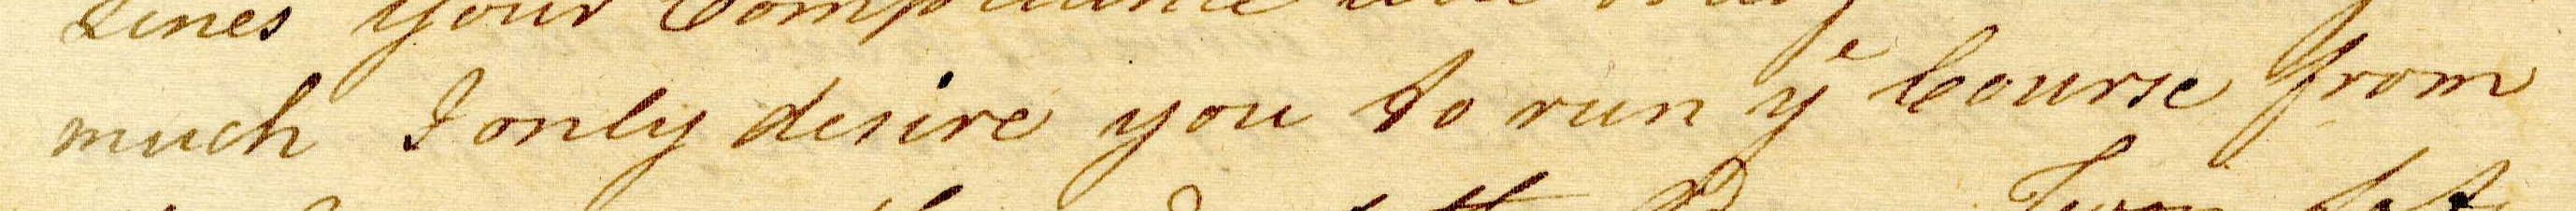much I only desire you to run y^e Course from
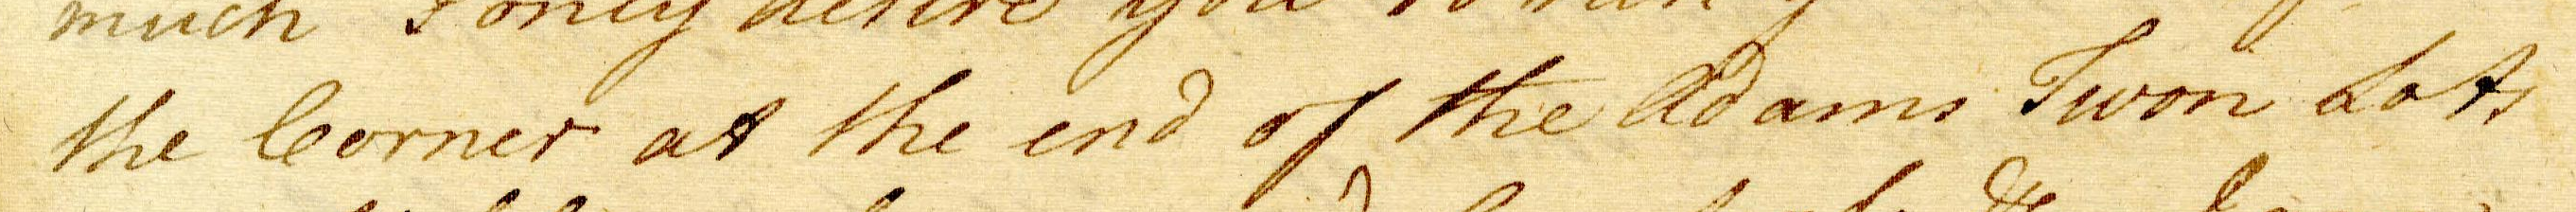the Corner at the end of the Adams Twon Lots
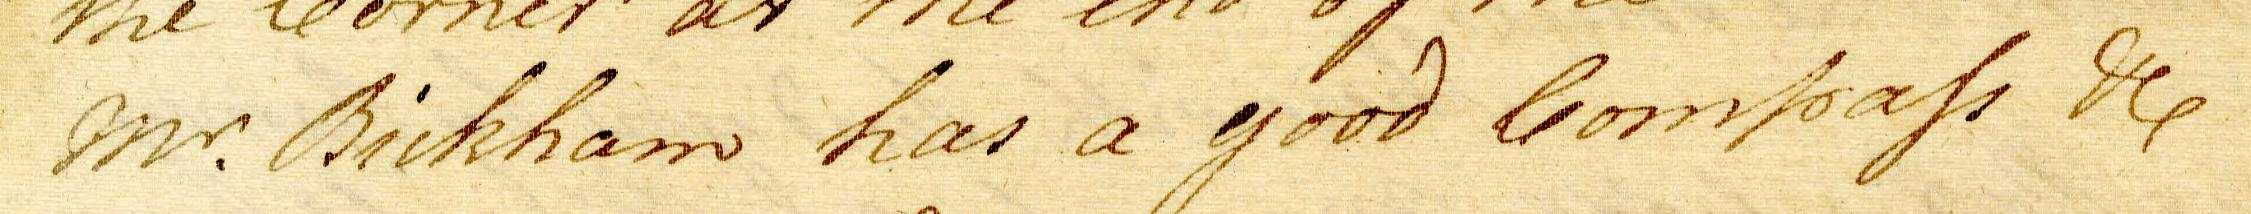M^r. Bickham has a good Compass &
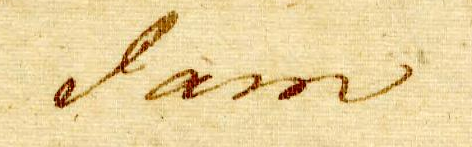I am
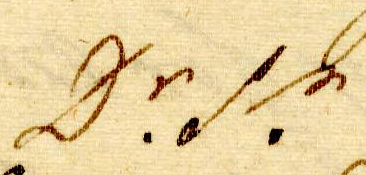D^r. S^r.
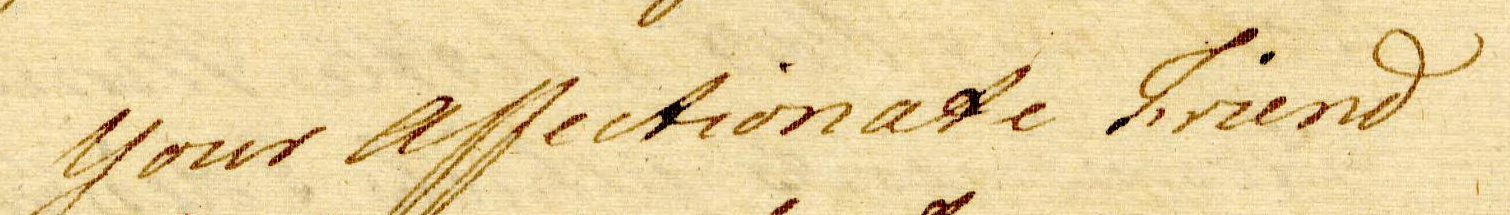Your Affectionate Friend
